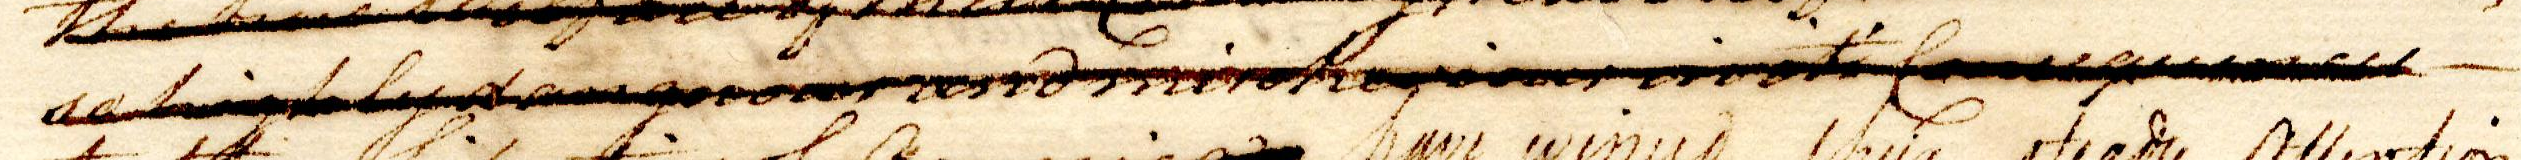[so highly dangeorus and mich] [_______] [with Consequence\
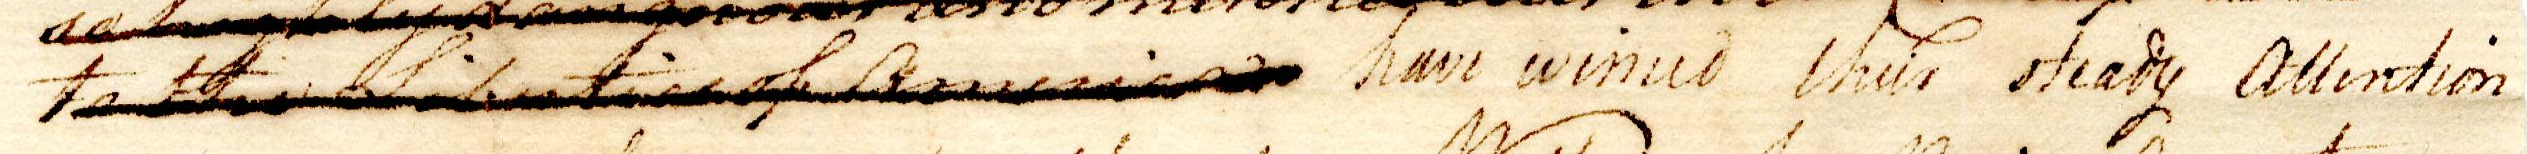[to the Liberties of America] have evinced their steady Attention
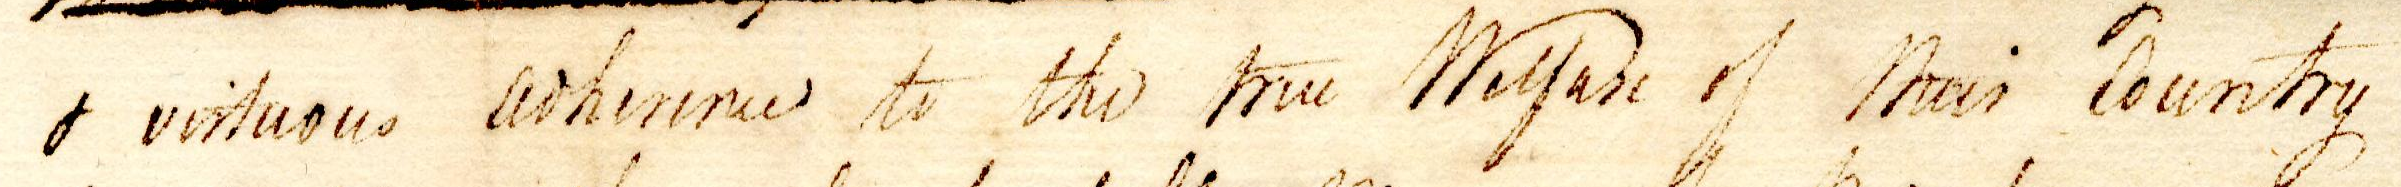& virtuous adherence to the true Welfare of their country
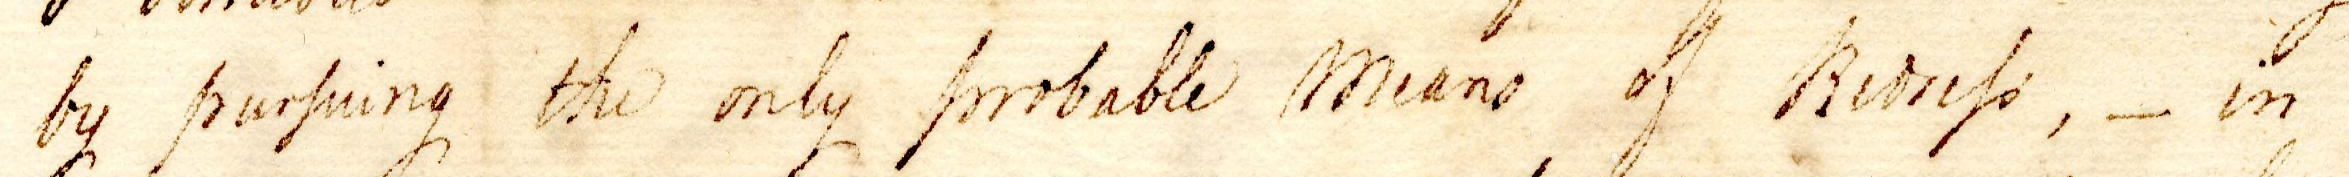by pursuing the only probable Means of Redress, in
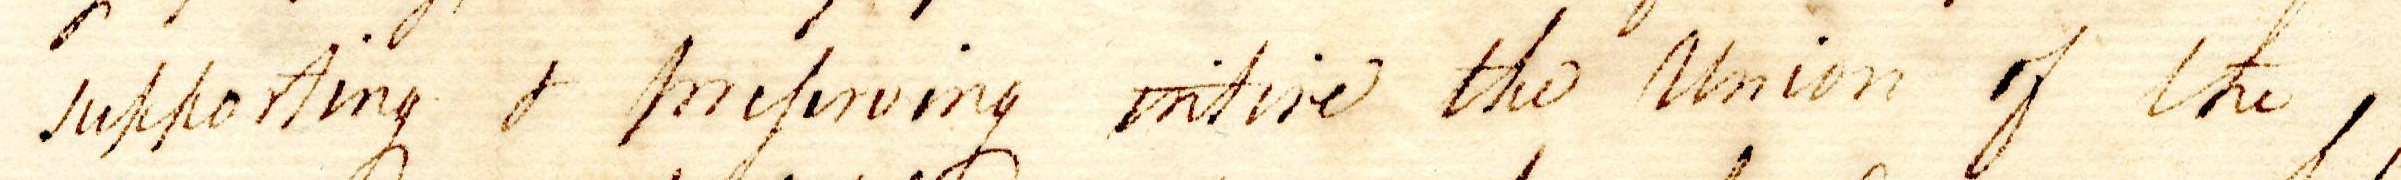supporting & preserving intire the Union of the
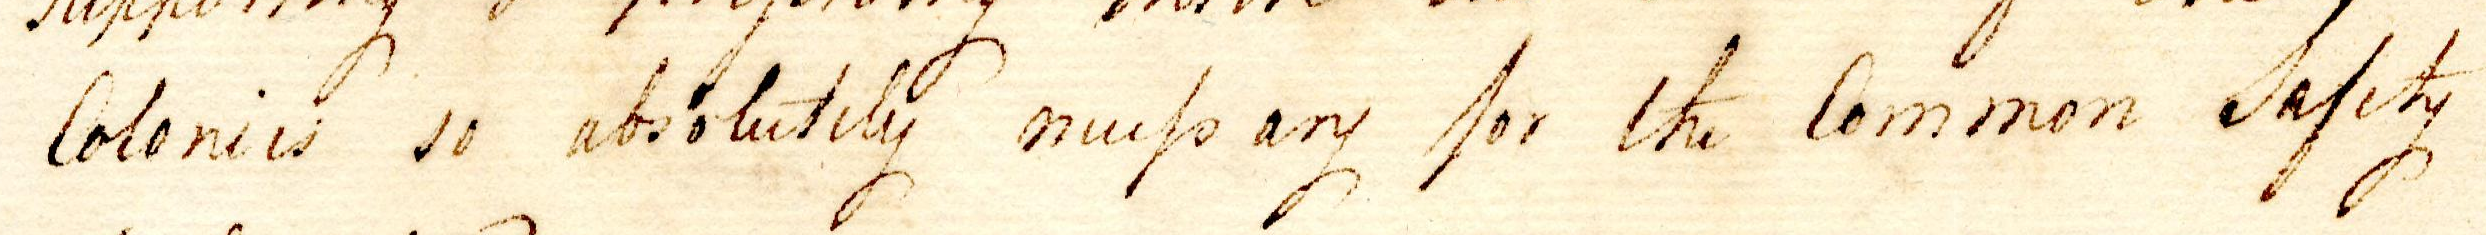Colonies so absolutely necessary for the Common Safety
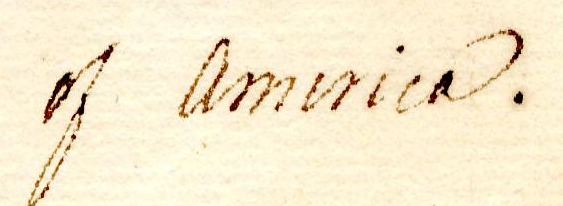of America.
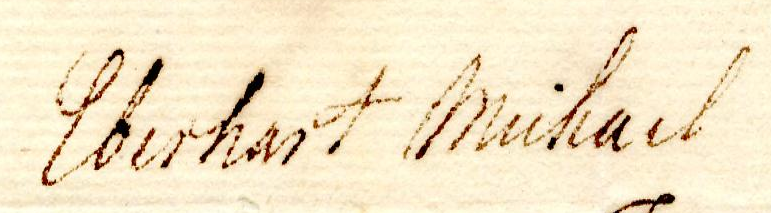Eberhart Michael
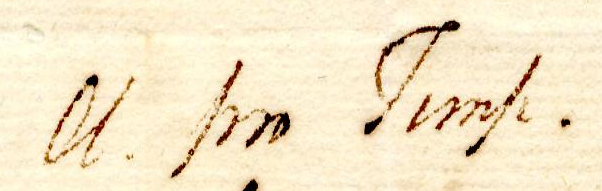A. pro Temp.
